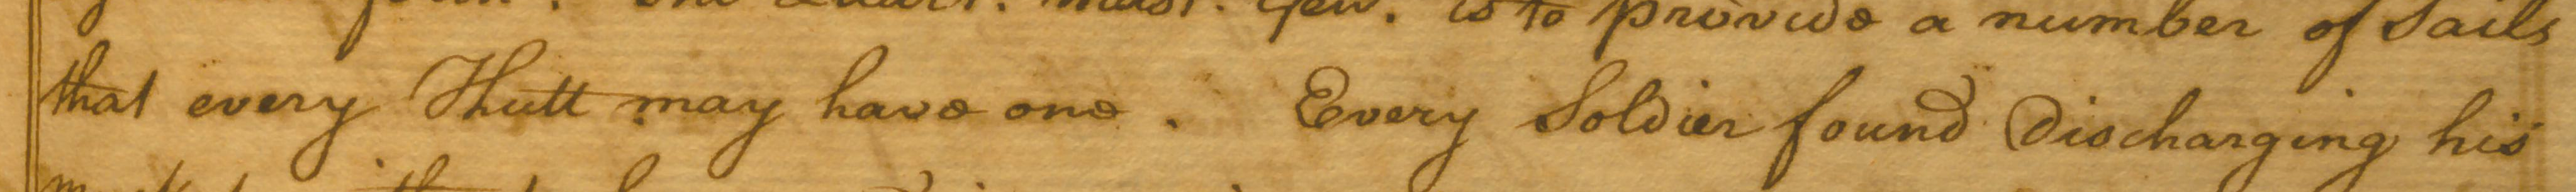that every Hutt may have one. Every Soldier found discharging his
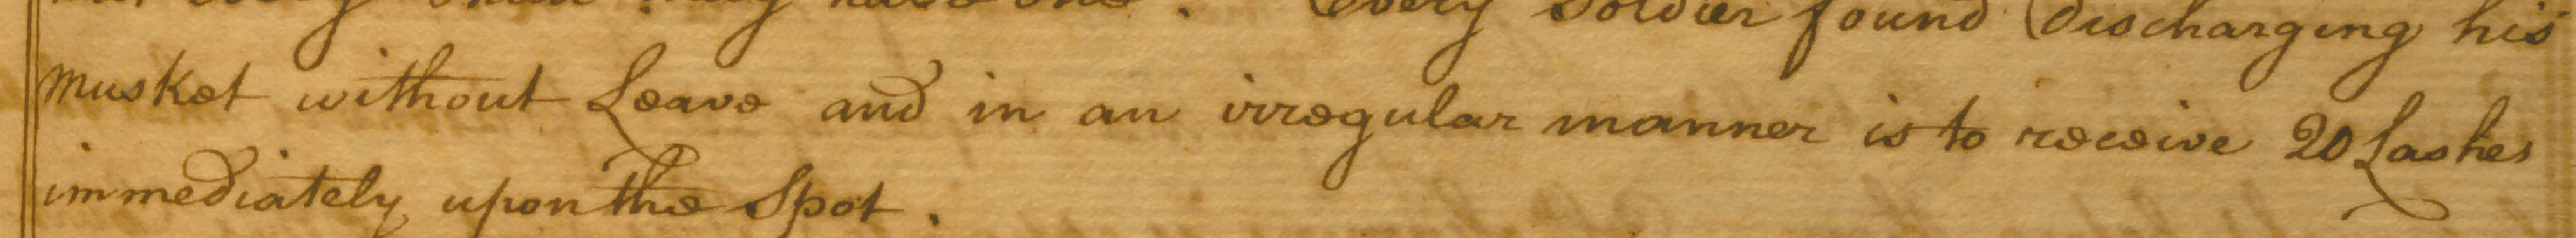musket without Leave and in an irregular manner is to receive 20 Lashes
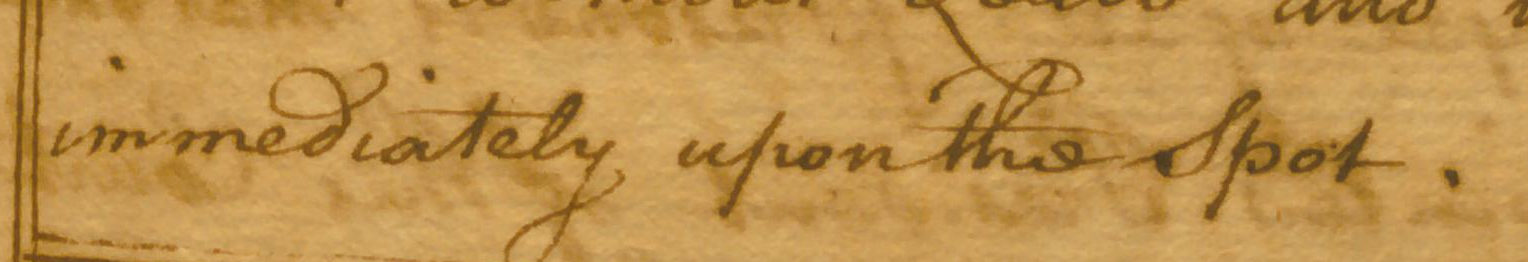immediately upon the spot.
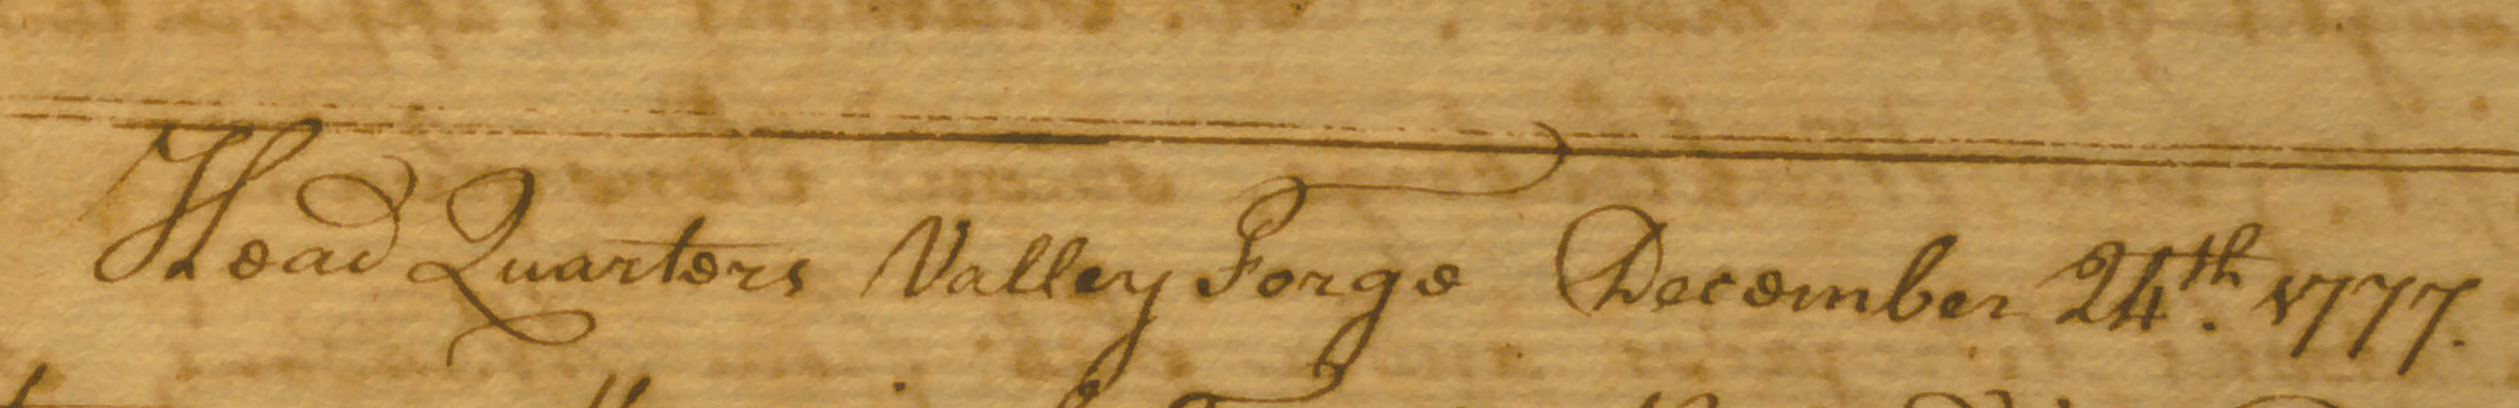Head Quarters Valley Forge December 24^th. 1777.
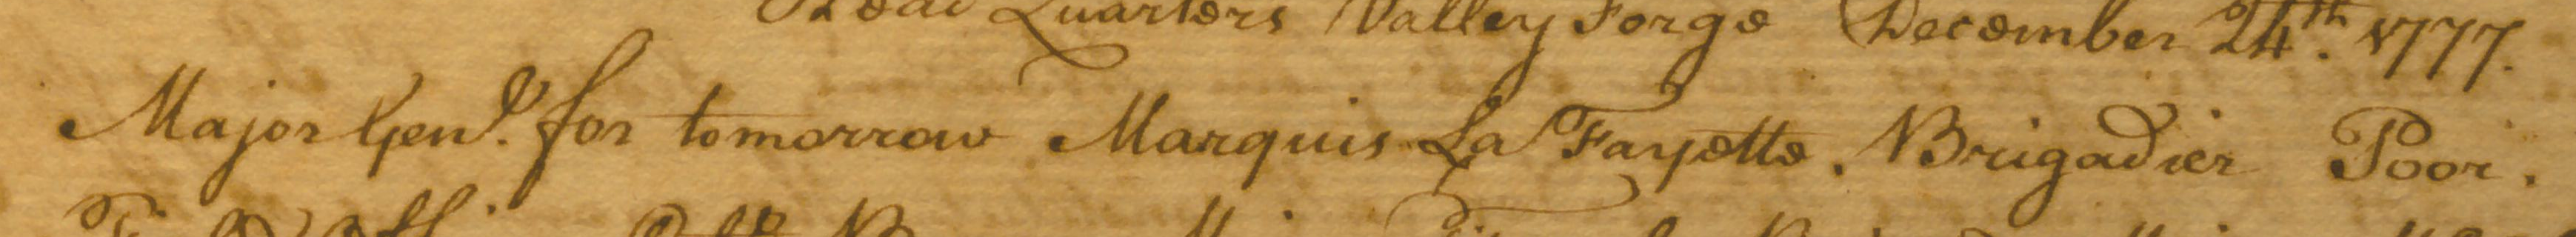Major Gen^l. for tomorrow Marquis La Fayette. Brigadier Poor.
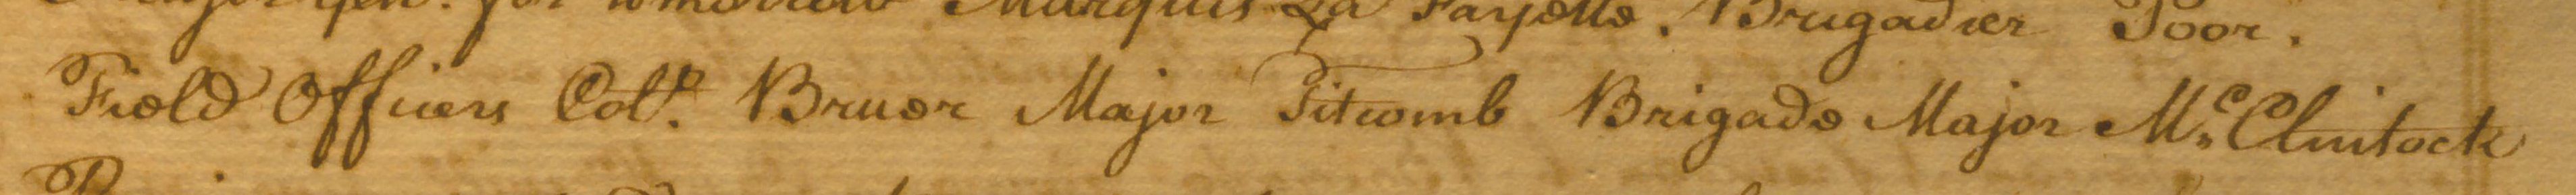Field Officers Col^o. Bruer Major Titcomb Brigade Major M^c.Clintock
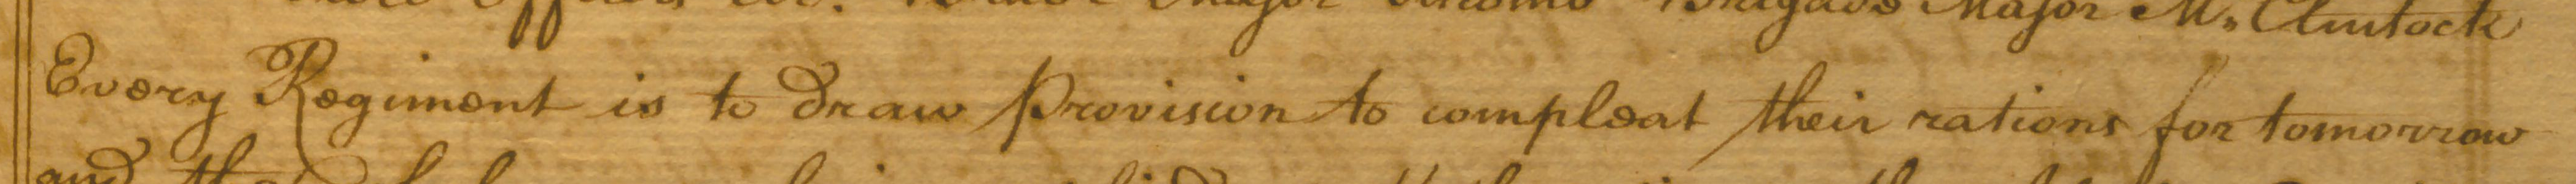Every Regiment is to draw Provision to compleat their rations for tomorrow
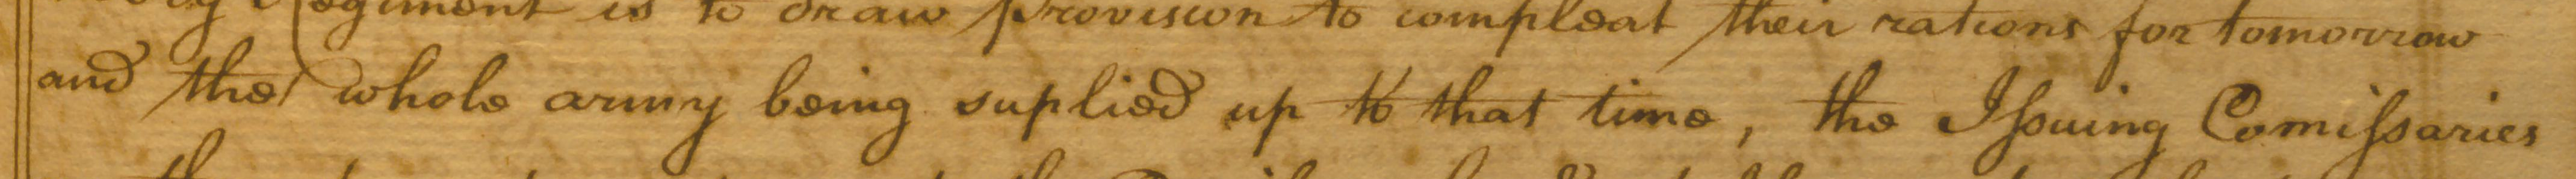and the whole army being suplied up to that time, the Issuing Commissaries
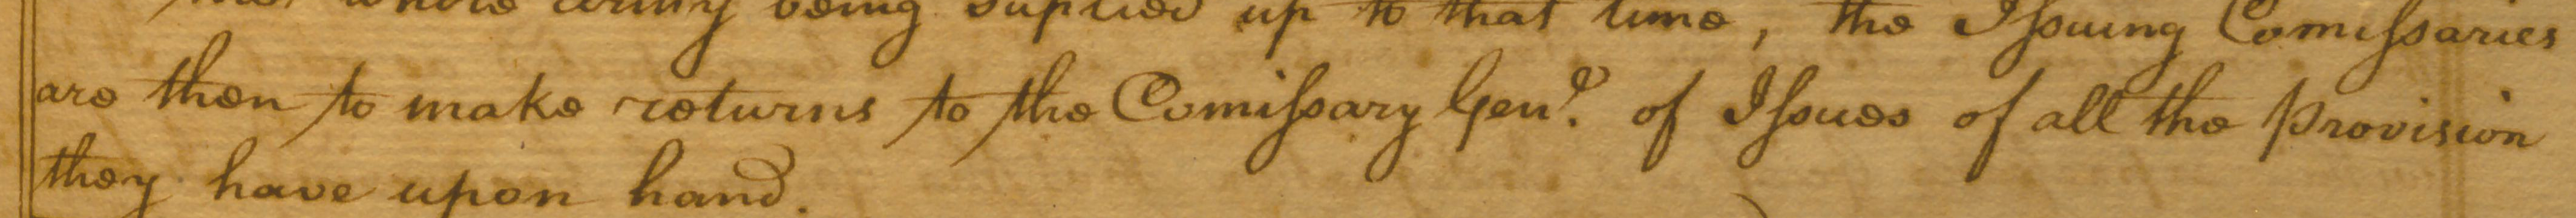are then to make returns to the Commissary Gen^l. of Issues of all the Provision
